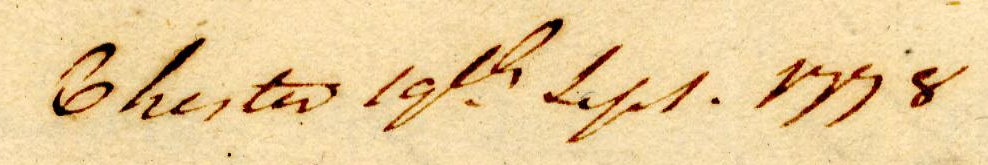Chester 19^t Sept. 1778
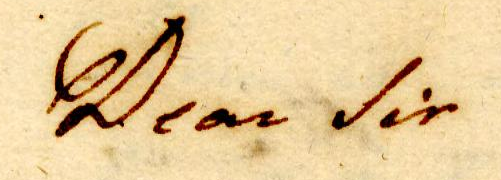Dear Sir
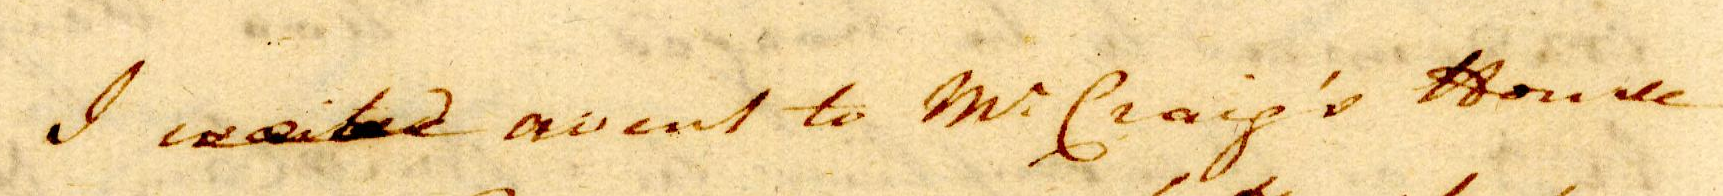I visited went to M^r. Craig's House
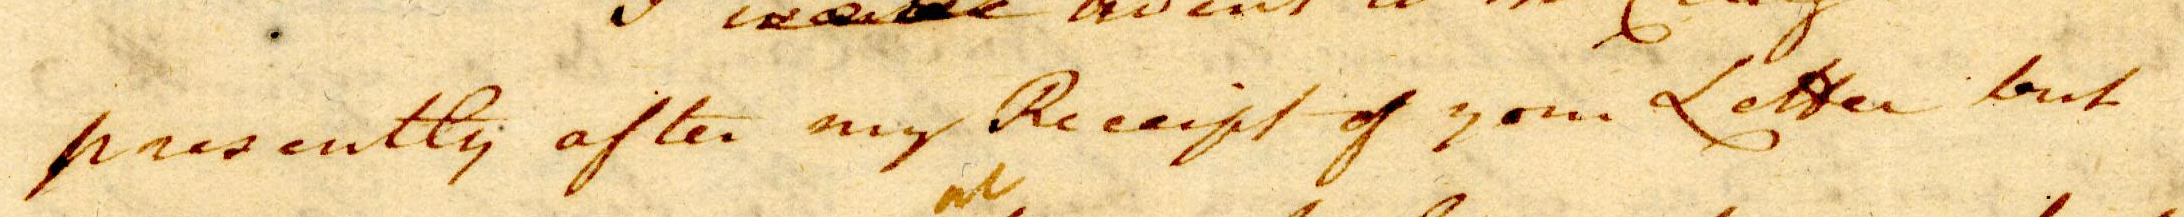presently after my Receipt of your Letter but
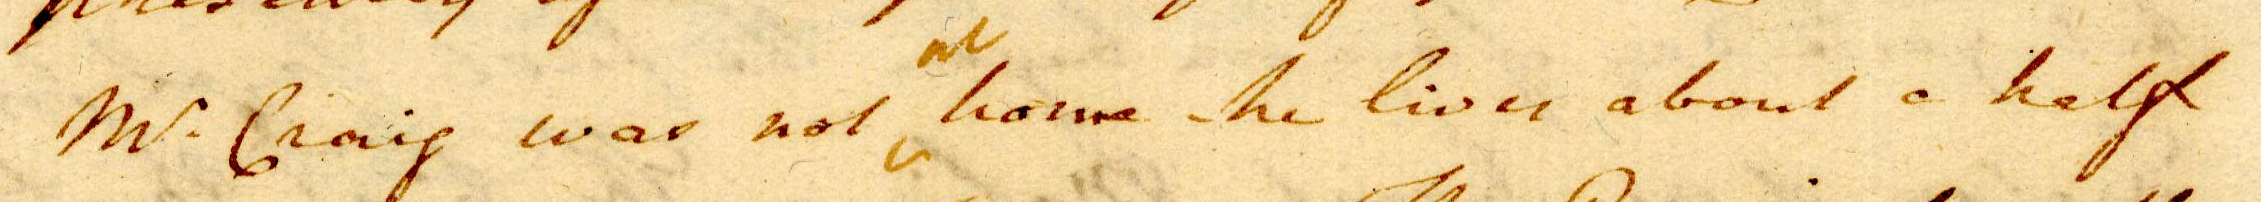M^r. Ciaig was not home he lives about a half
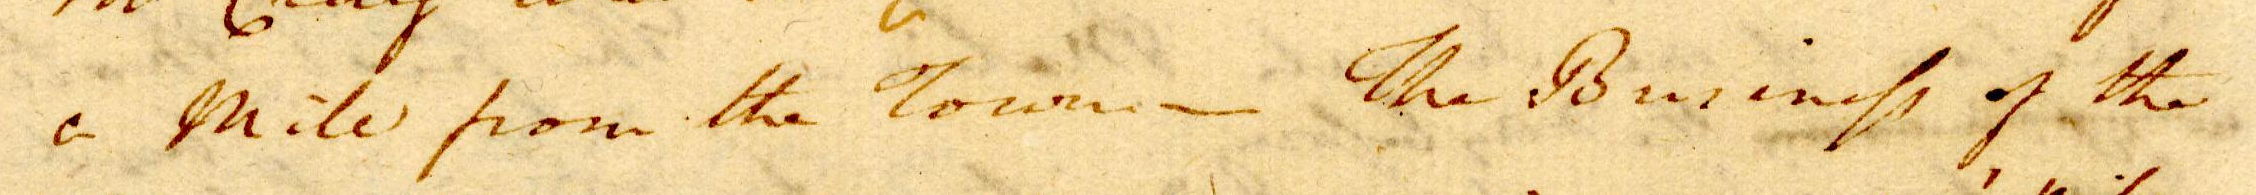a Mile from the Town. The Business of the
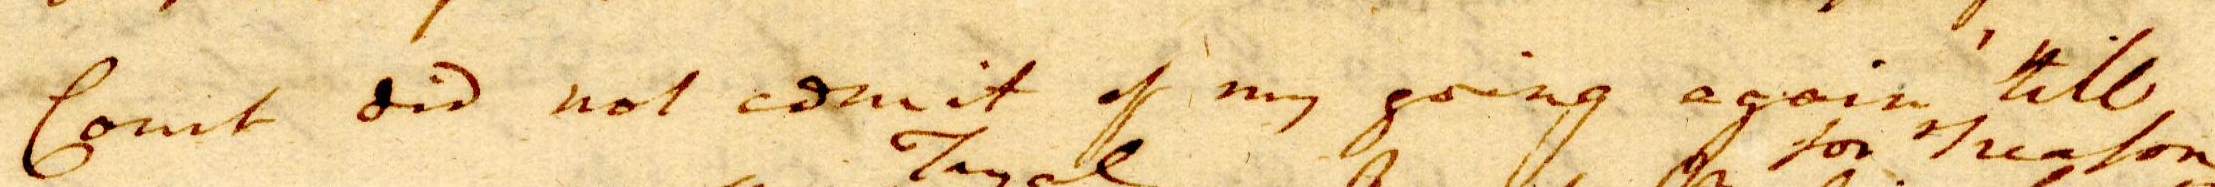Court did not comit of my going again till
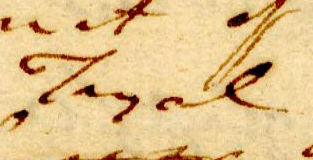Tryal
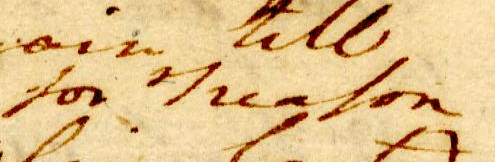for treason
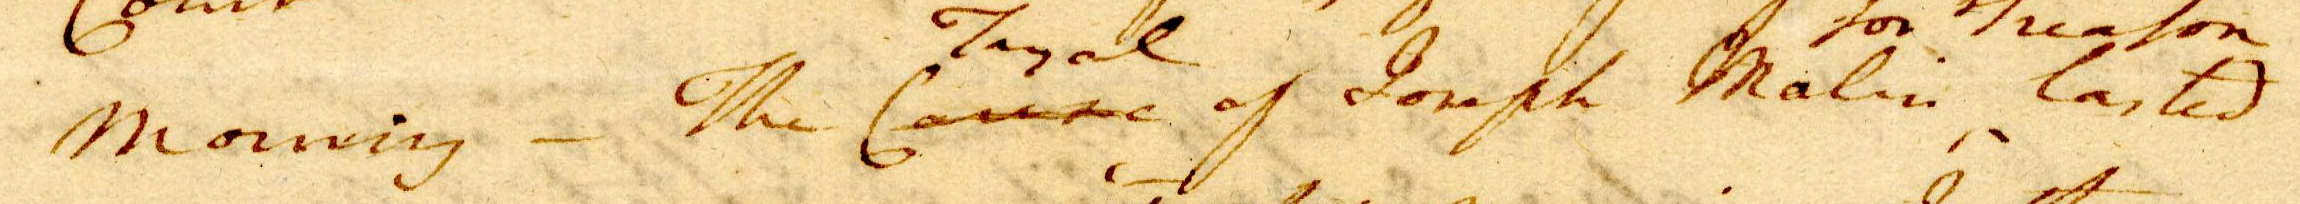Morning. The Cause of Joseph Malin ^ lasted
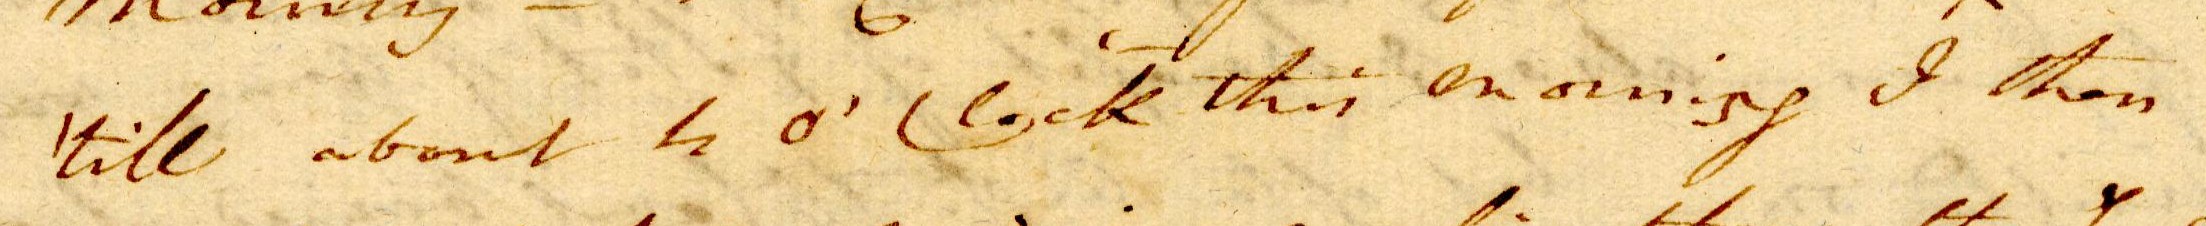'till about 4 O'Clock this morning I then
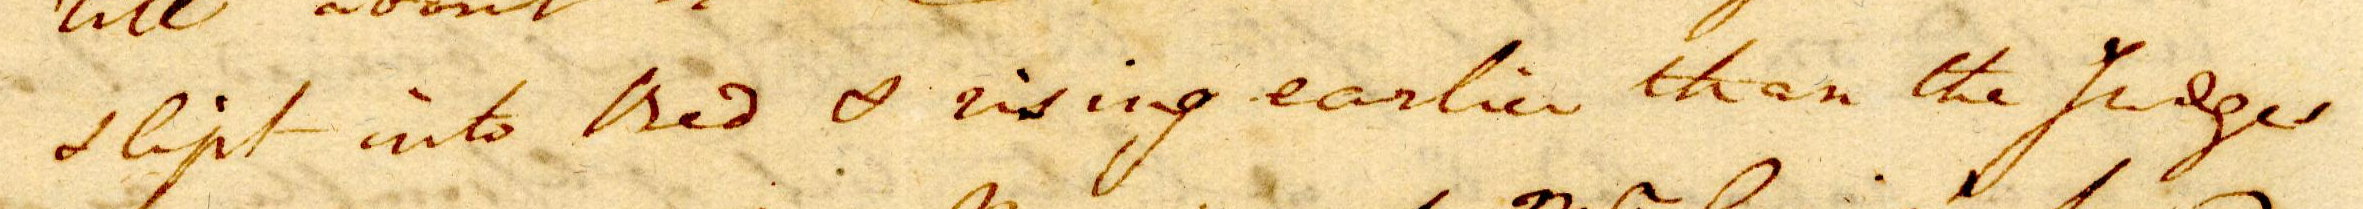slipt into Bed & rising earlier than the Judges
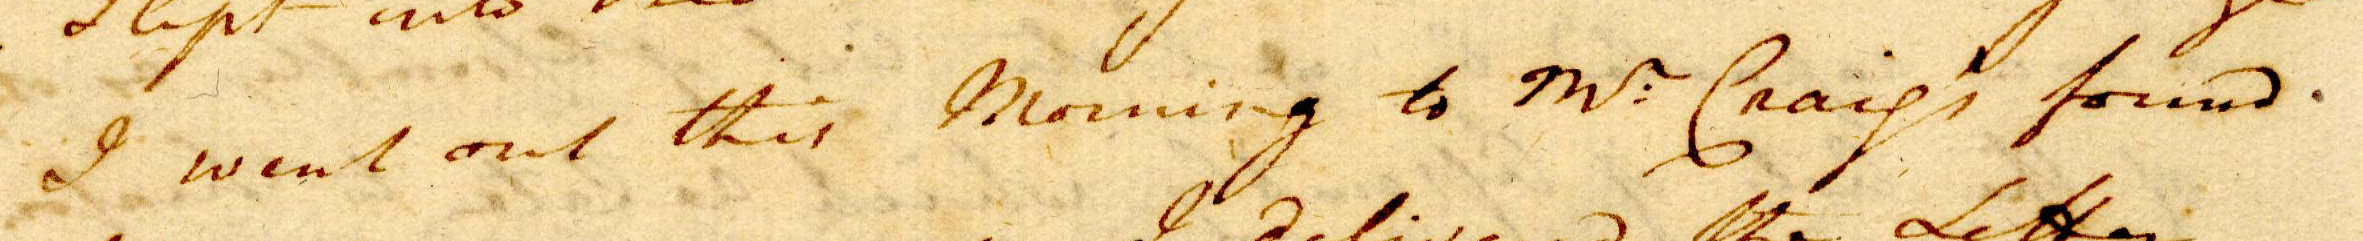I went out this Morning to M^r. Craig's found
